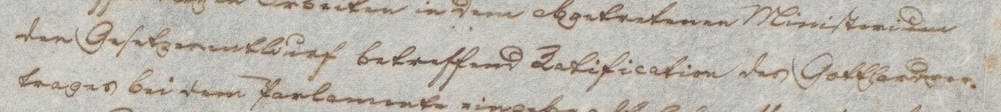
den Gesetzesentwurf betreffend Ratification des Gotthardver-
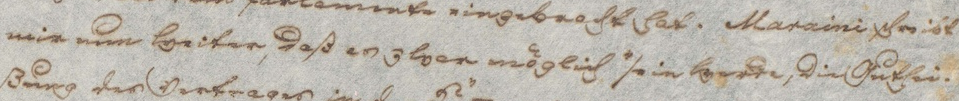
mir nun weiter, daß es zwar « möglich » sein werde, die Guthei-
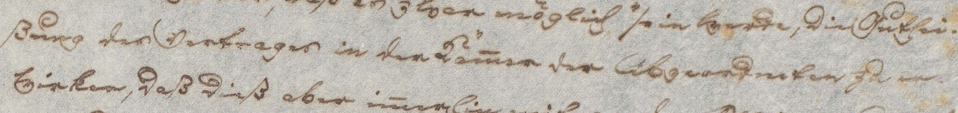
ßung des Vertrages in der Kammer der Abgeordneten zu er-
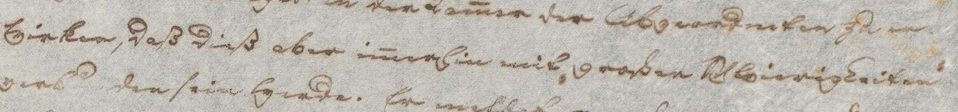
wirken, daß dieß aber immerhin mit «großen Schwierigkeiten»
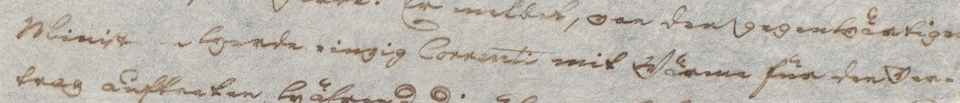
Ministern werde einzig Correnti mit Wärme für den Ver-
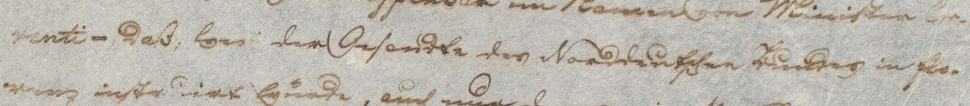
renti –, daß, was der Gesandte des Norddeutschen Bundes in Flo-
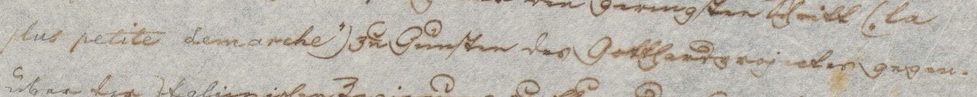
plus petite demarche») zu Gunsten des Gotthardprojectes gegen-
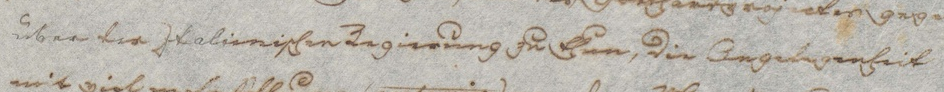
über der Italienischen Regierung zu thun, die Angelegenheit
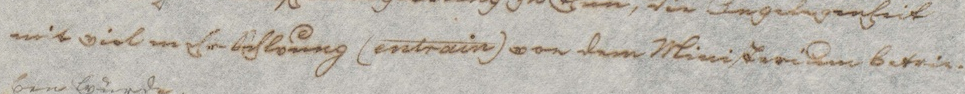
mit viel mehr Schwung (entrain) von dem Ministerium betrie-
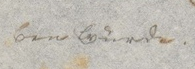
ben würde.
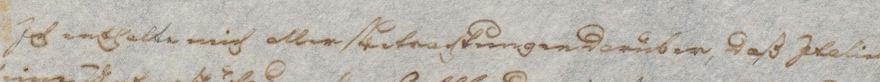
Ich enthalte mich aller Betrachtungen darüber, daß Italien
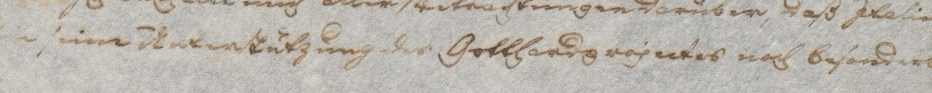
um seine Unterstützung des Gotthardprojectes noch besonders
